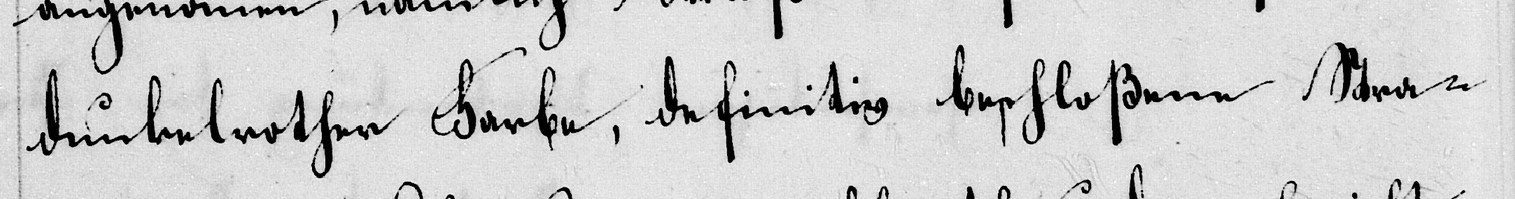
dunkelrother Farbe, definitiv beschloßene Stra¬
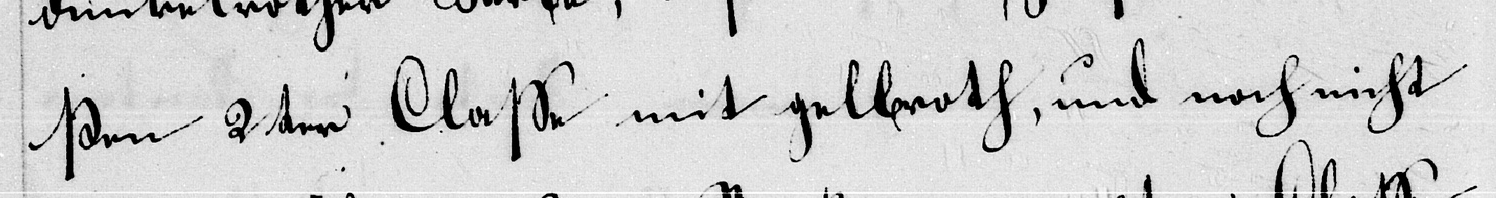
ßen 2ter Claße mit gelbroth, und noch nicht
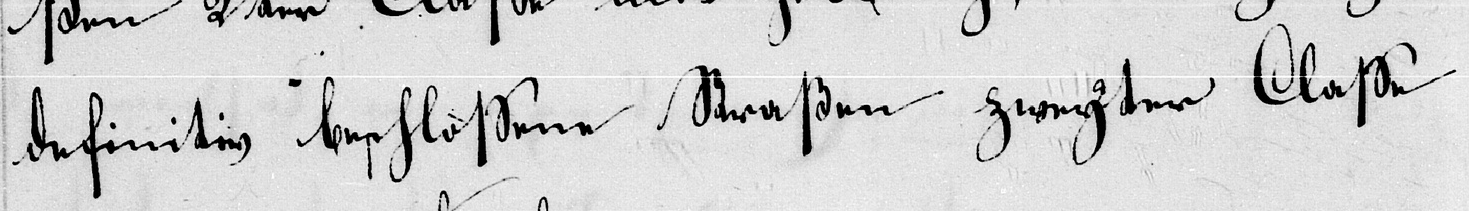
definitiv beschloßene Straßen zweyter Claße
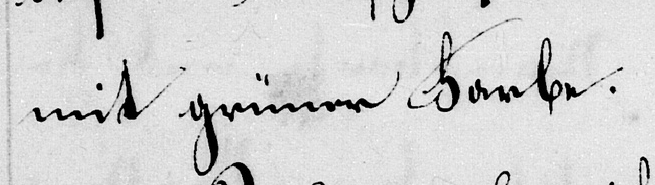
mit grüner Farbe.
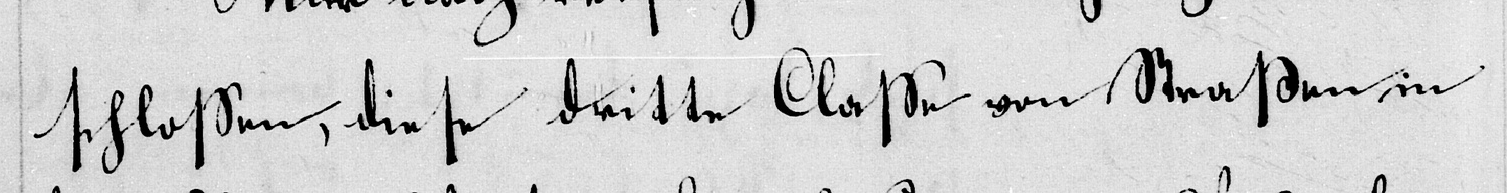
schloßen, diese dritte Claße von Straßen in
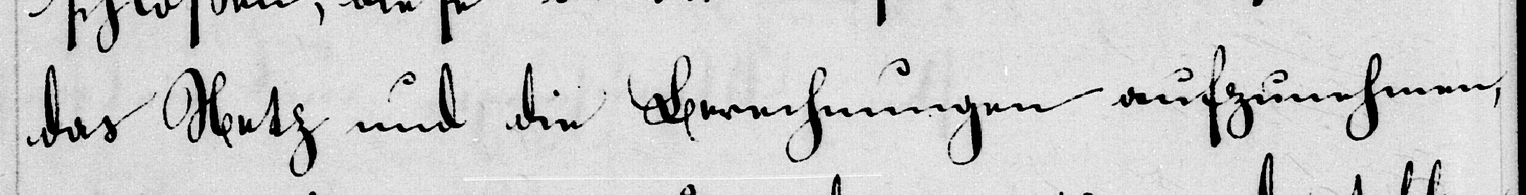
das Netz und die Berechnungen aufzunehmen,
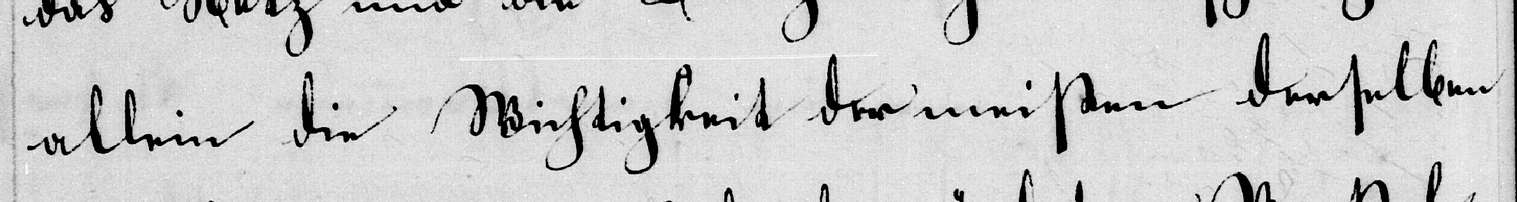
allein die Wichtigkeit der meisten derselben
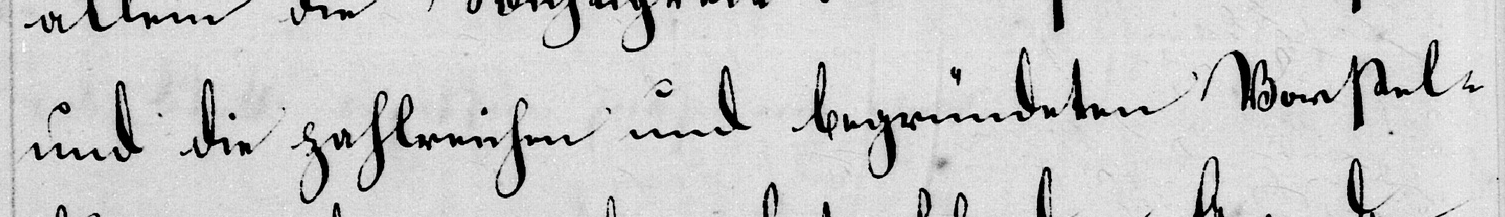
und die zahlreichen und begründeten Vorstel¬
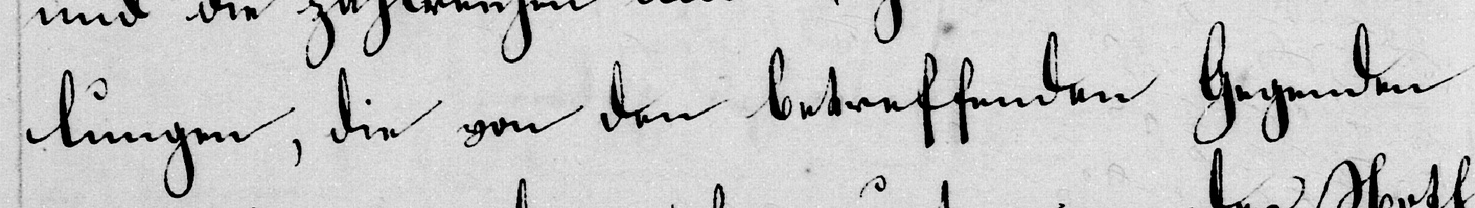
lungen, die von den betreffenden Gegenden
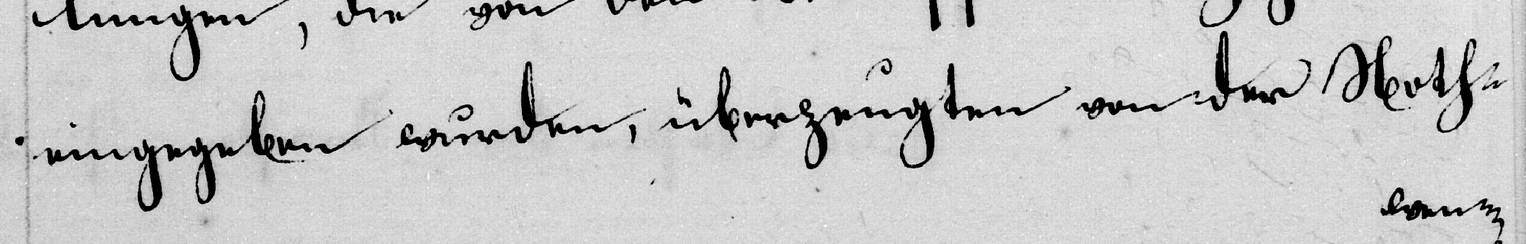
eingegeben wurden, überzeugten von der Noth-
